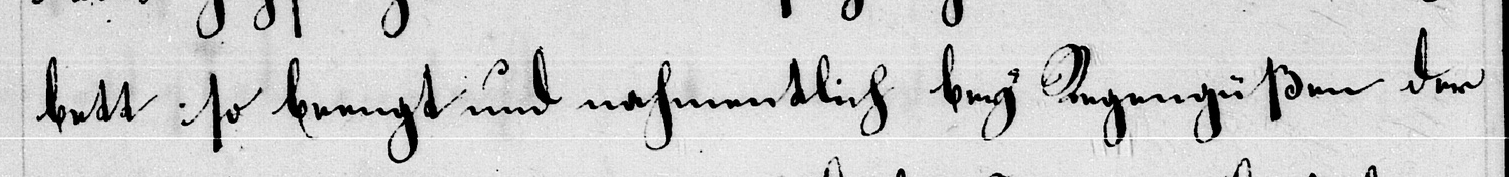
bett so beengt und nahmentlich bey Regengüßen der
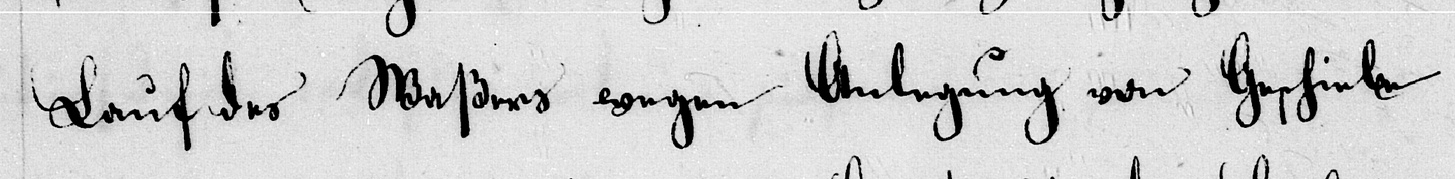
Lauf des Waßers wegen Anlegung von Geschiebe
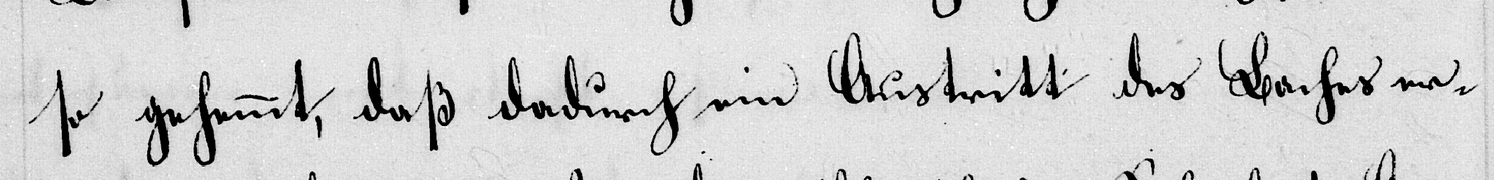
so gehemmt, daß dadurch ein Austritt des Baches er¬
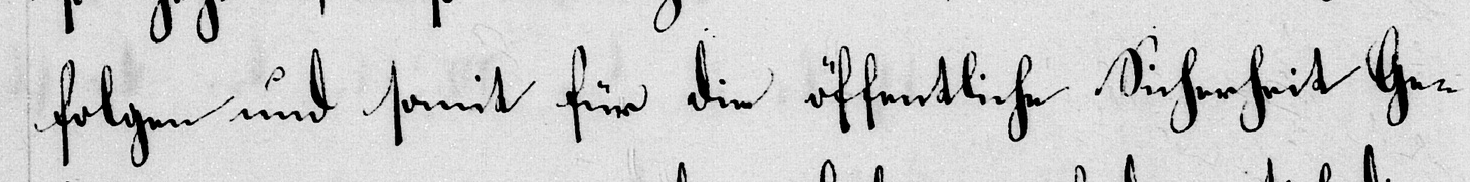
folgen und somit für die öffentliche Sicherheit Ge¬
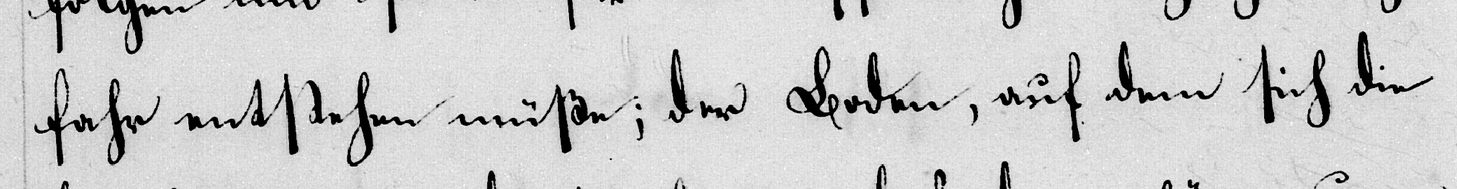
fahr entstehen müße; der Boden, auf dem sich die
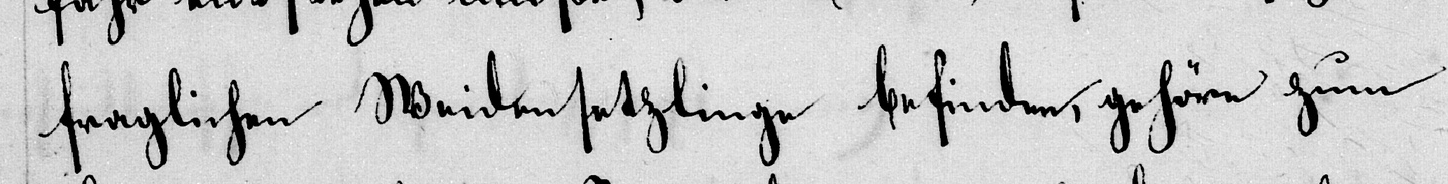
fraglichen Weidensetzlinge befinden, gehöre zum
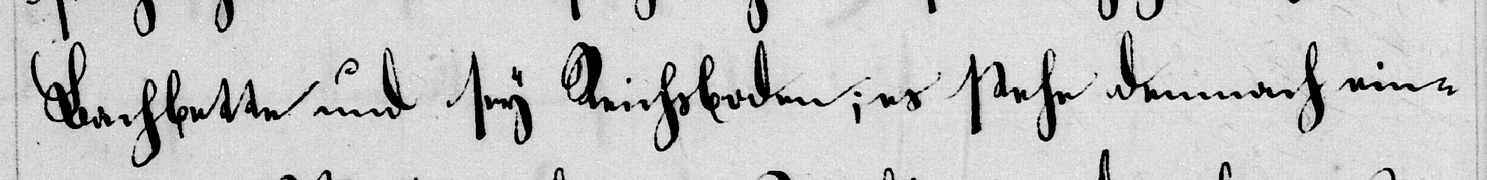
Bachbette und sey Reichsboden; es stehe demnach ein¬
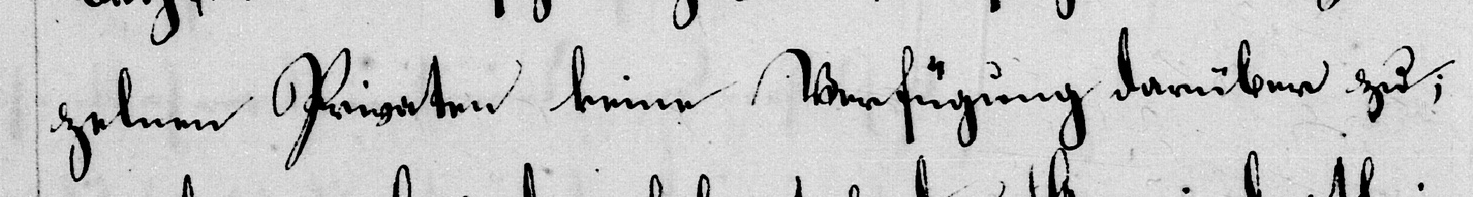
zelnen Privaten keine Verfügung darüber zu;
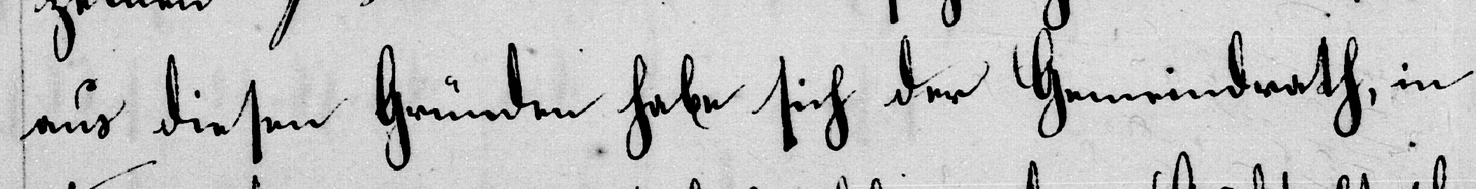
aus diesen Gründen habe sich der Gemeindrath, in
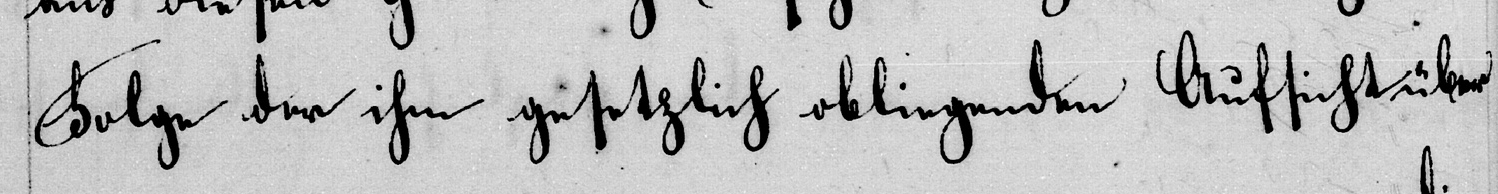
Folge der ihm gesetzlich obliegenden Aufsicht über
